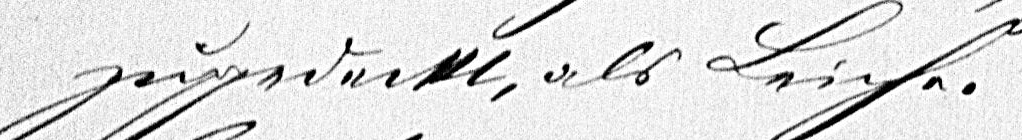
zugedeckt, als Leiche.
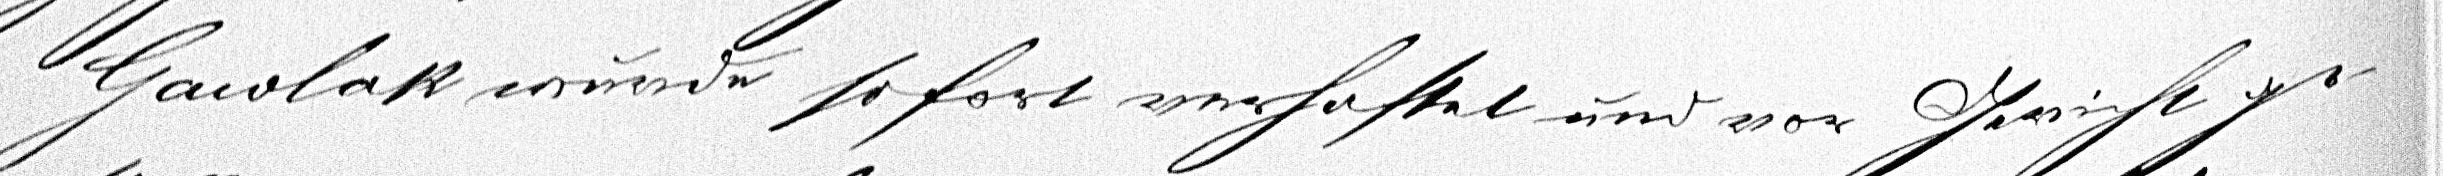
Gawlak wurde sofort verhaftet und vor Gericht ge¬
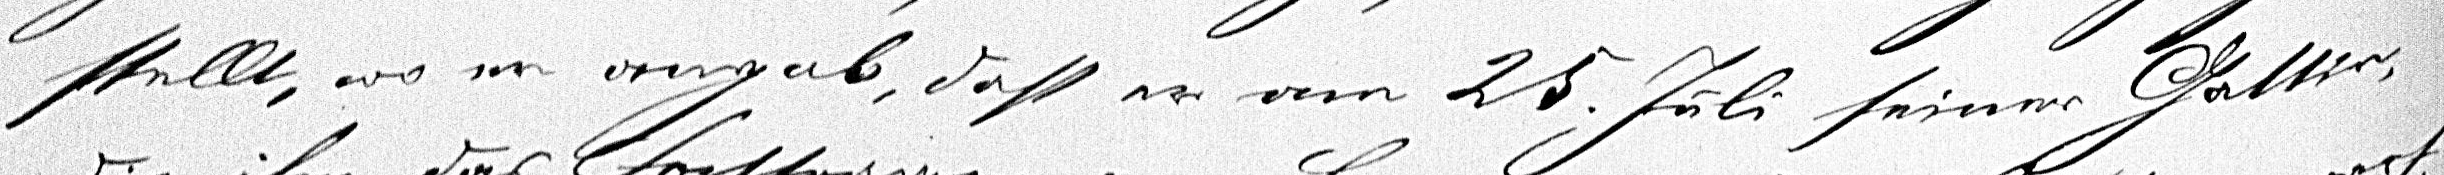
stellt, wo er angab, daß er am 25. Juli seiner Gattin,
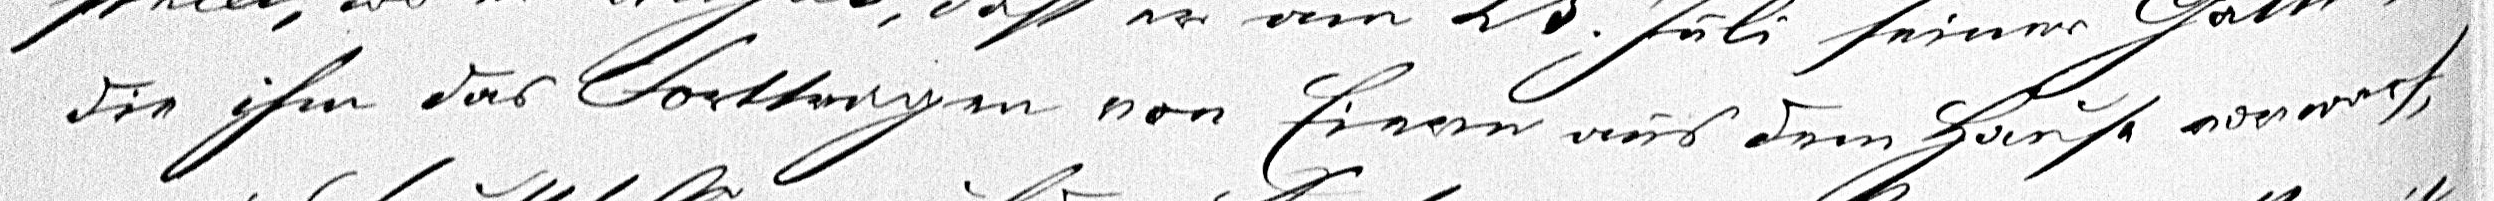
die ihm das Forttragen von Eiern aus dem Hause vorwarf,
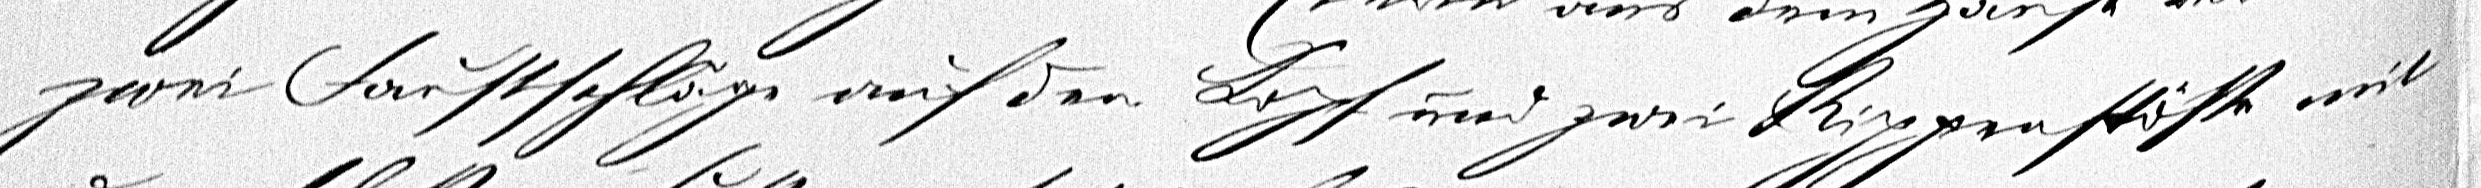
zwei Faustschläge auf den Kopf und zwei Rippenstöße mit
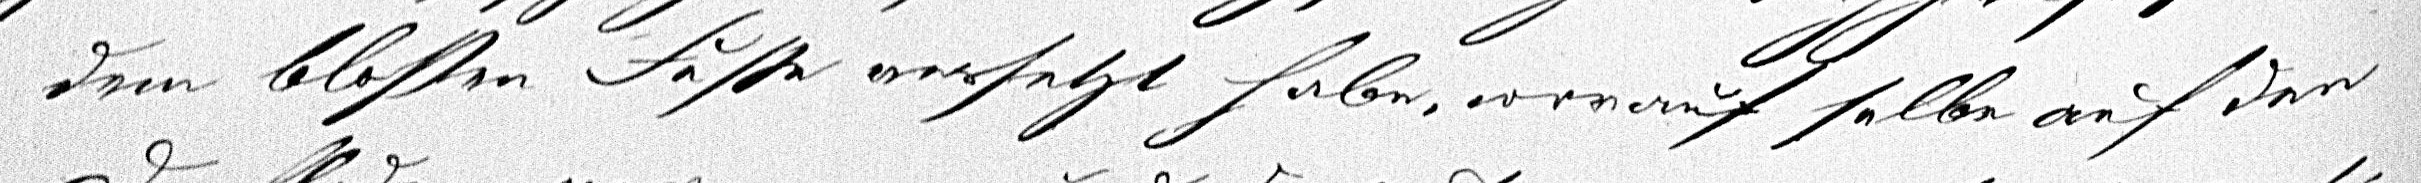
dem bloßen Fuße versetzt habe, worauf selbe auf den
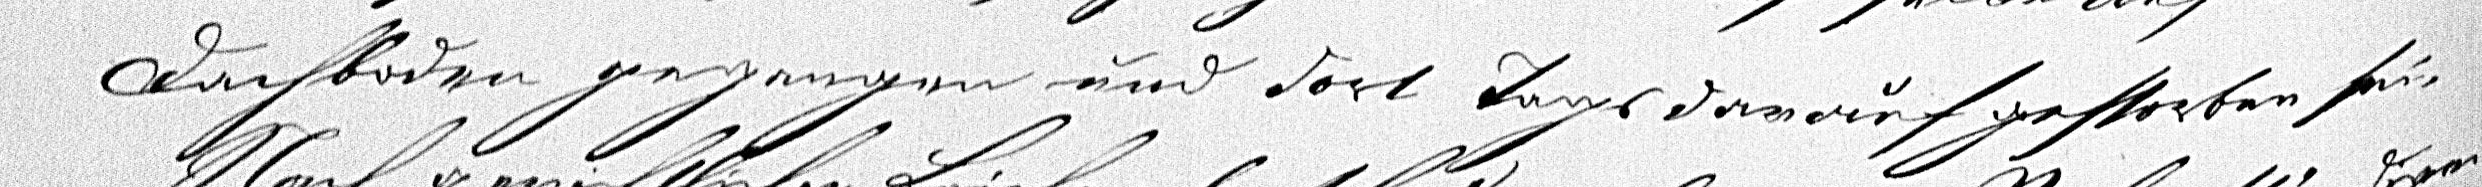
Dachboden gegangen und dort Tags darauf gestorben sei.
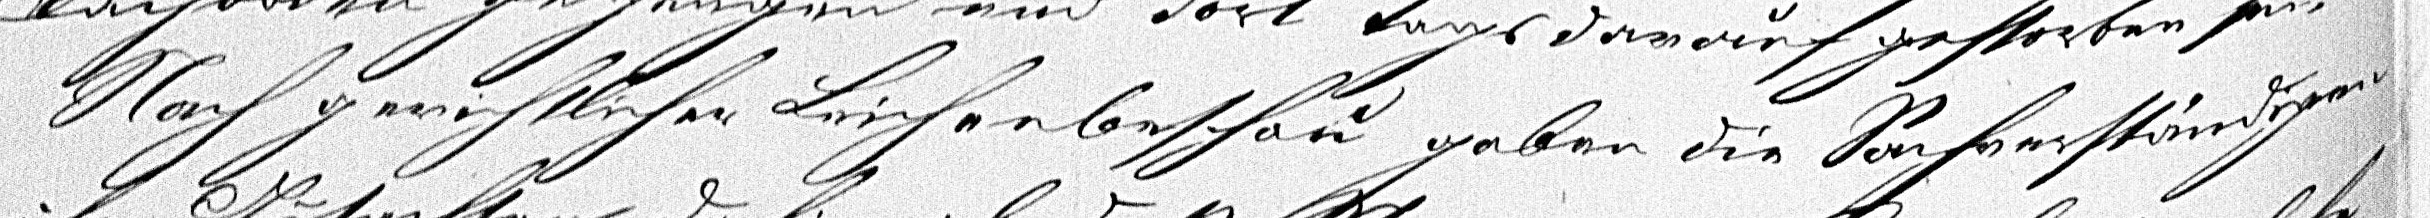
Nach gerichtlicher Leichenbeschau geben die Sachverständigen
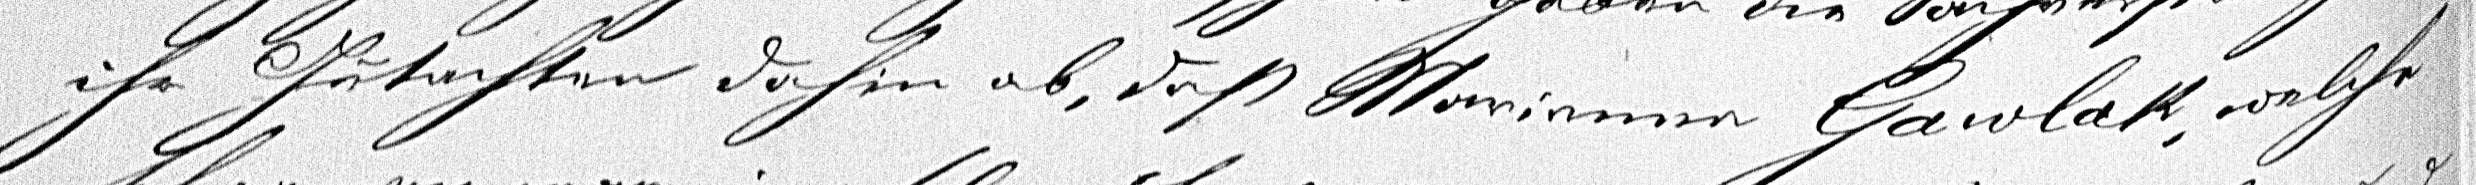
ihr Gutachten dahin ab, daß Marianne Gawlak, welche
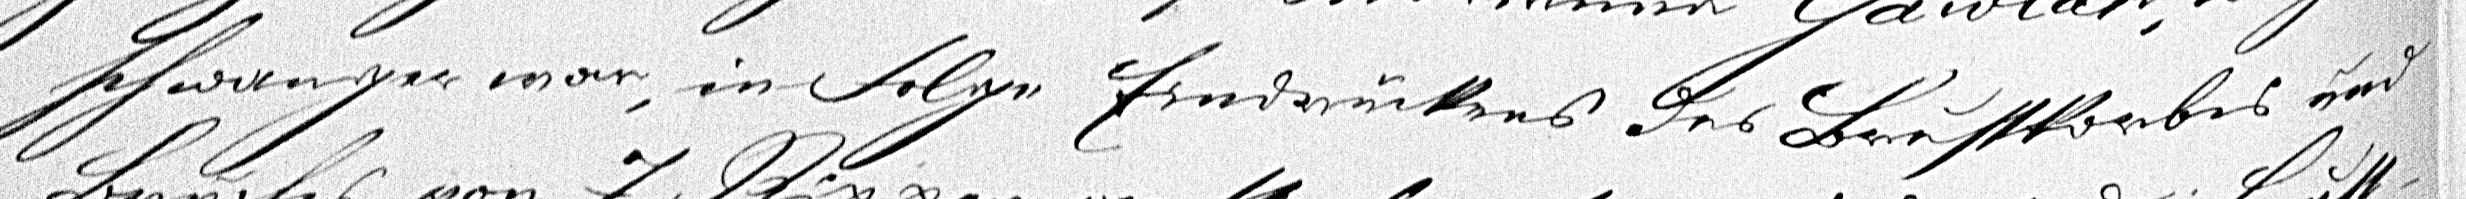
schwanger war, in Folge Eindrückens des Brustkorbes und
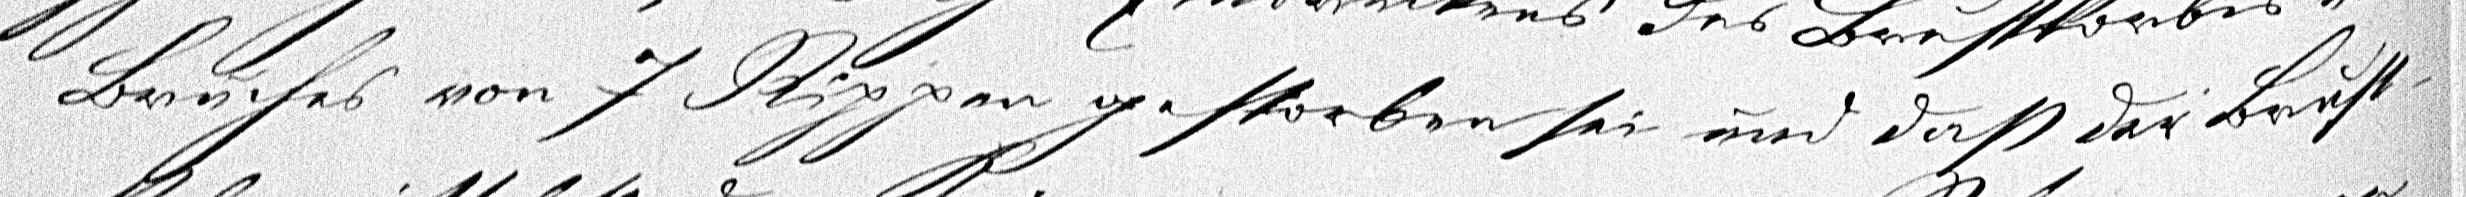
Bruches von 7 Rippen gestorben sei und daß der Brust¬
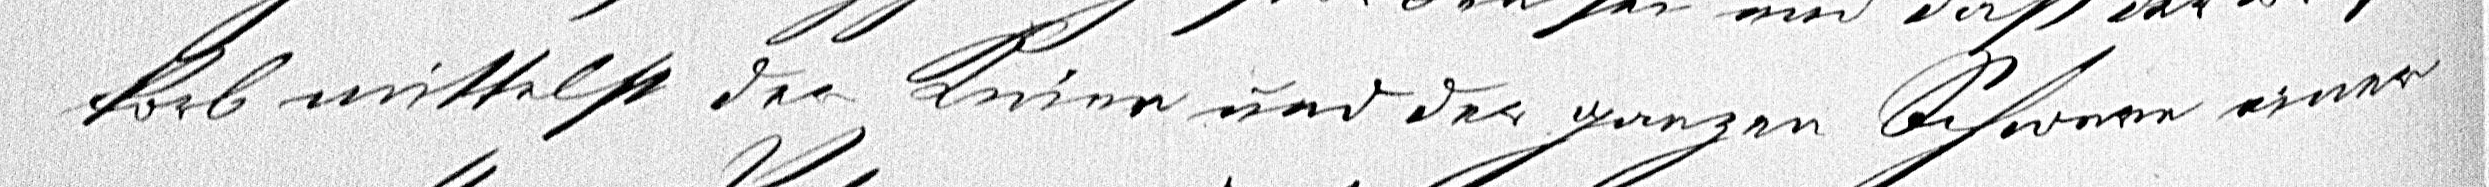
korb mittelst der Beine und der ganzen Schwere einer
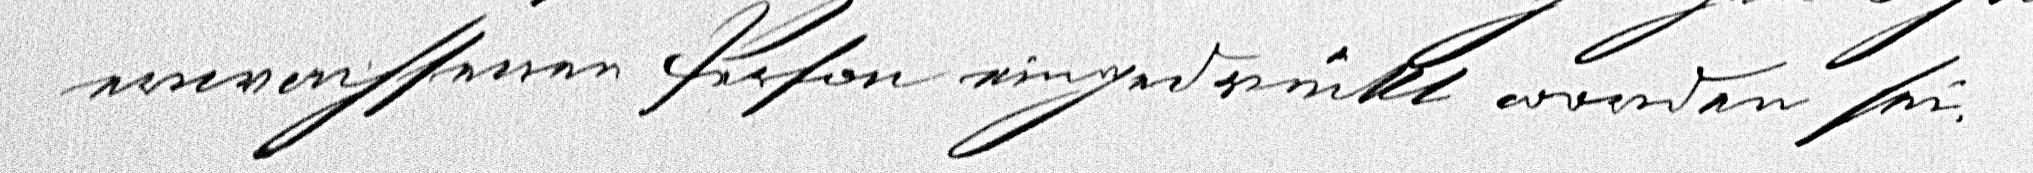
erwachsenen Person eingedrückt worden sei.
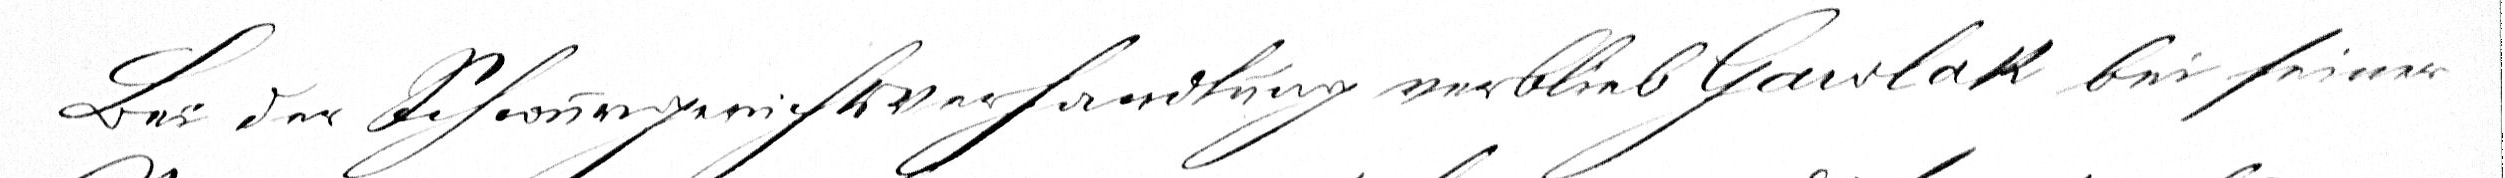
Bei der Schwurgerichtverhandlung verblieb Gawlak bei seiner
